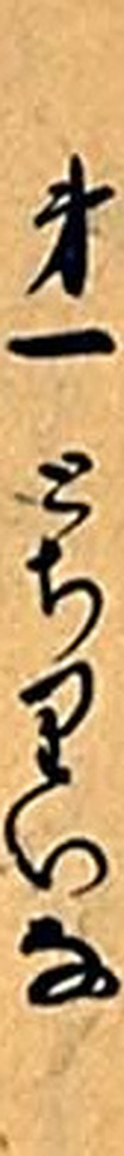第一とちりいな
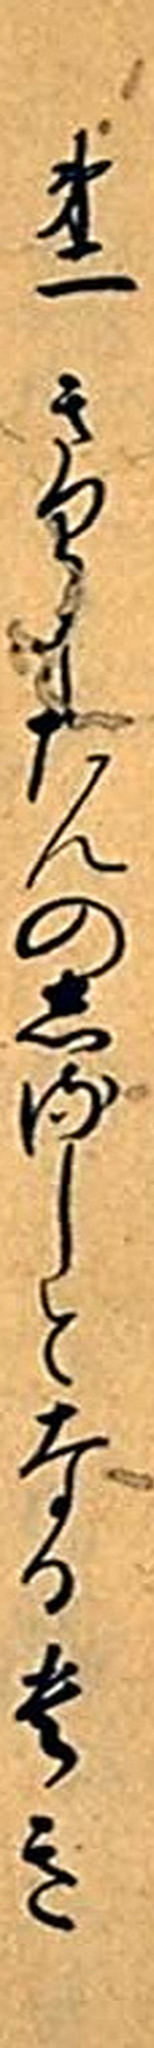第二きりしたんのしるしとなる貴き
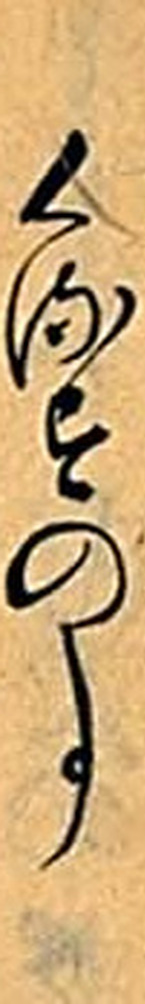くるすの事
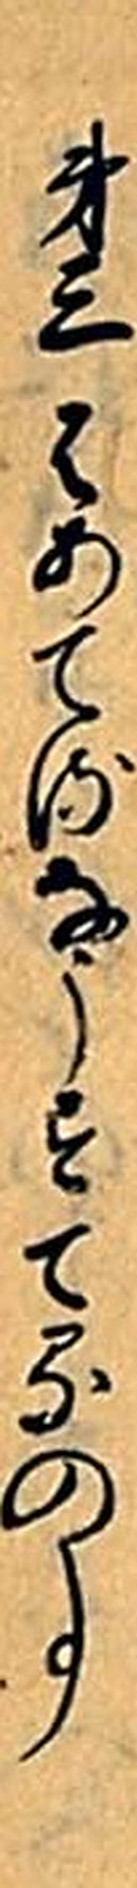第三はあてるなうすてるの事
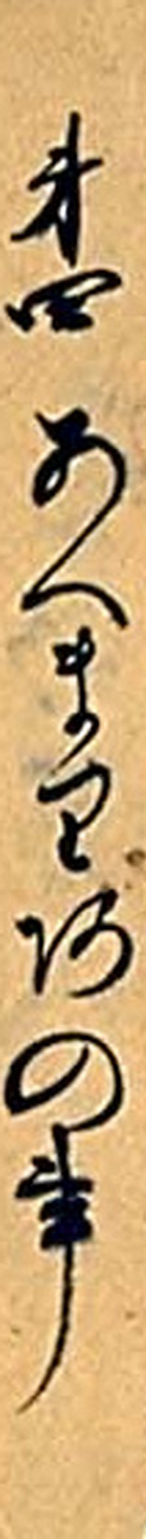第四あへまりあの事
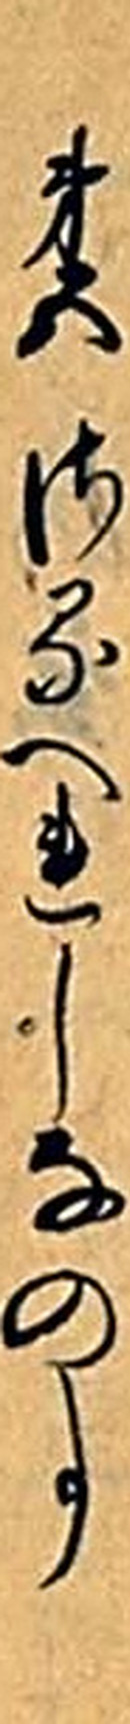第五さるへれしなの事
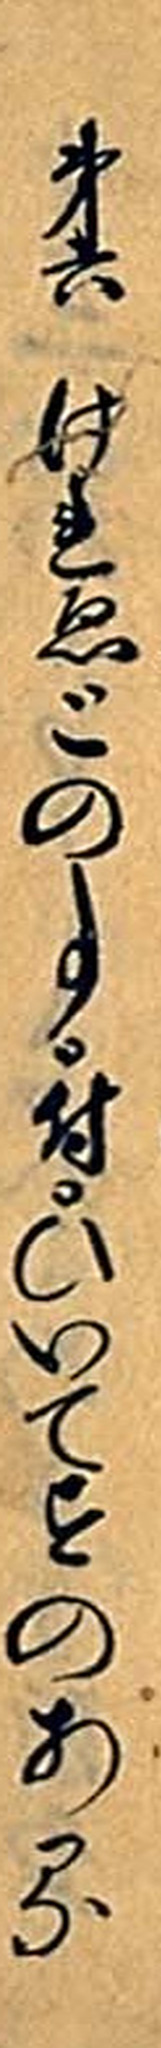第六けれゑとの事◦付◦ひいてすのある
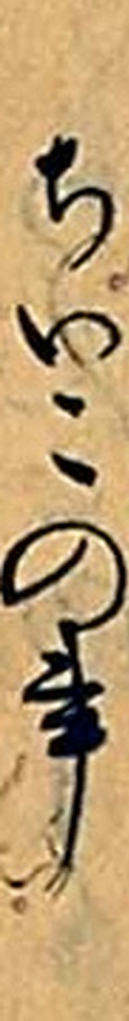ちいこの事
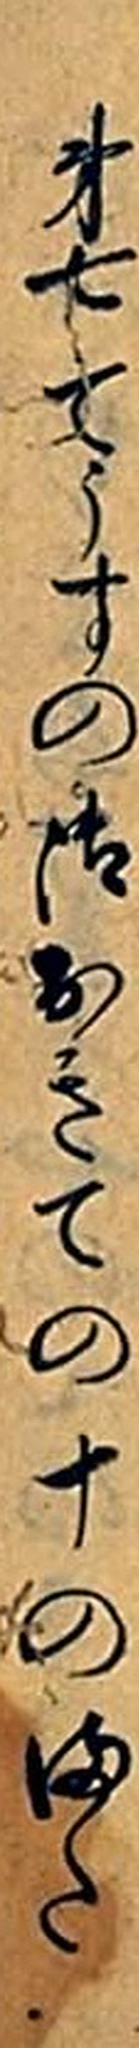第七てうすの御おきての十のまた
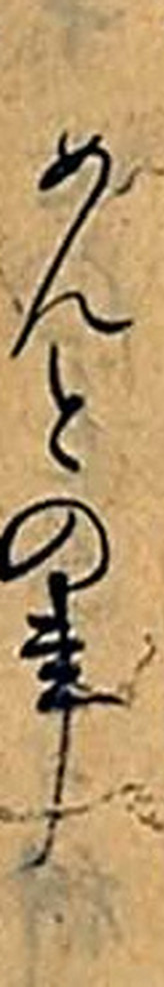めんとの事
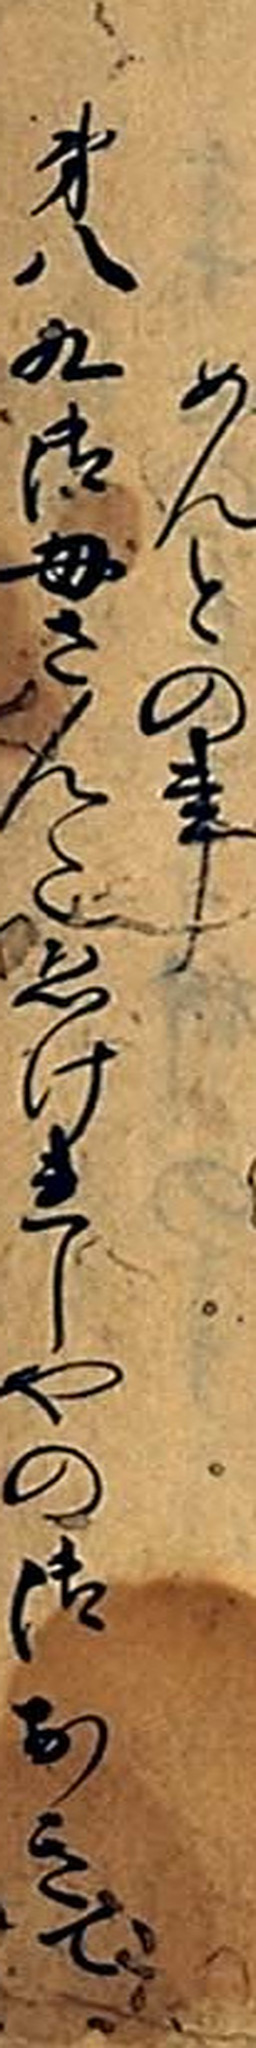第八九御母さんたゑけれしやの御おきて

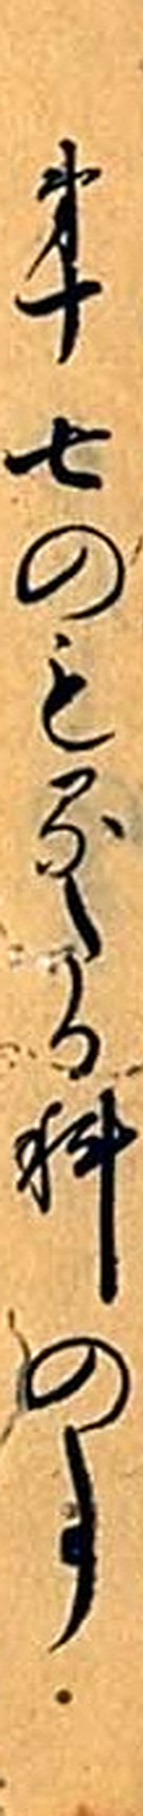第十七のもるたる科の事
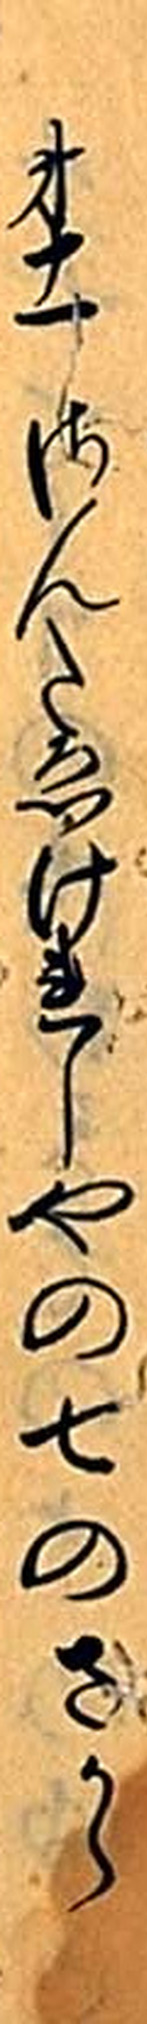第十一さんたゑけれしやの七のさから
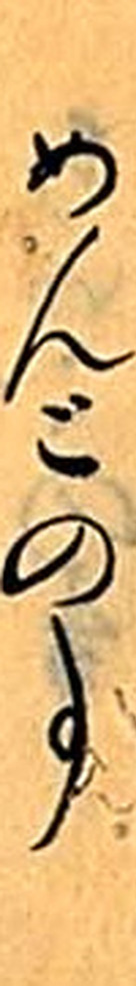めんとの事
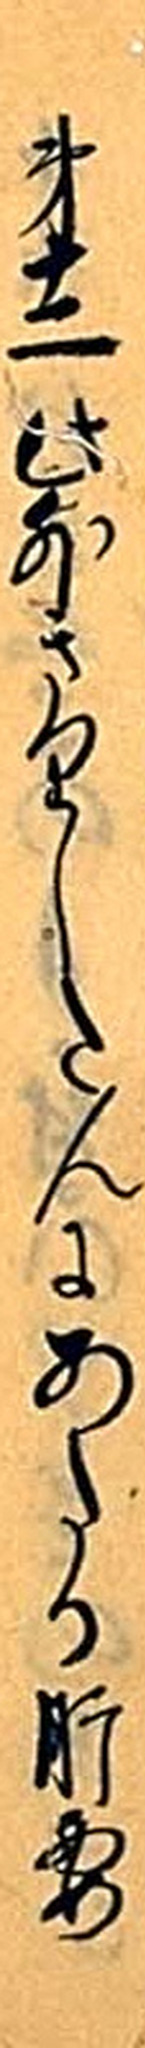第十二此外きりしたんにあたる肝要
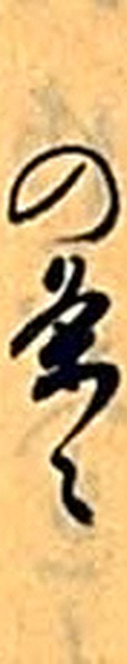の条々
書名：ドチリナ・キリシタン
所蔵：東京大学総合図書館 / General Library in the University of Tokyo
